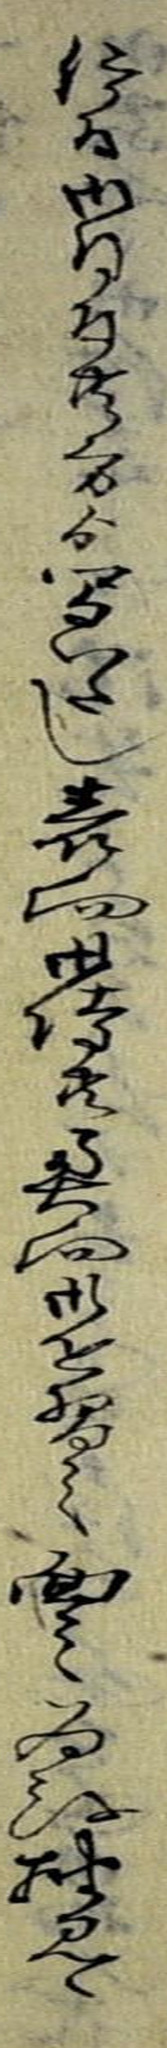仰付御目付共方ゟ写いたし表向御侍共奥向御近習之面々へ為致披見候
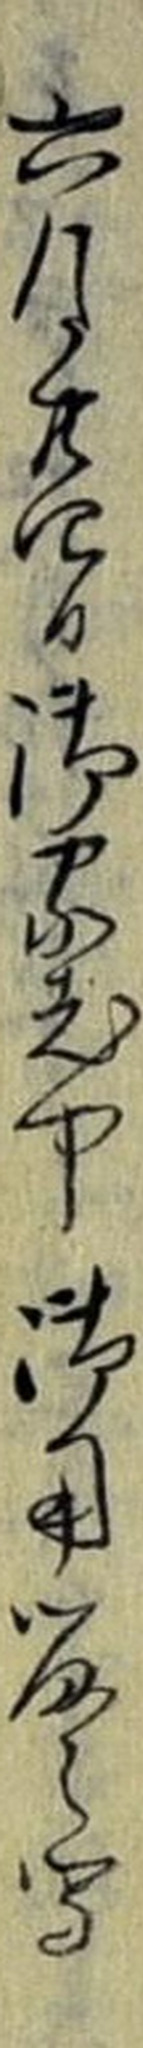六月廿四日御家老中御用留之写
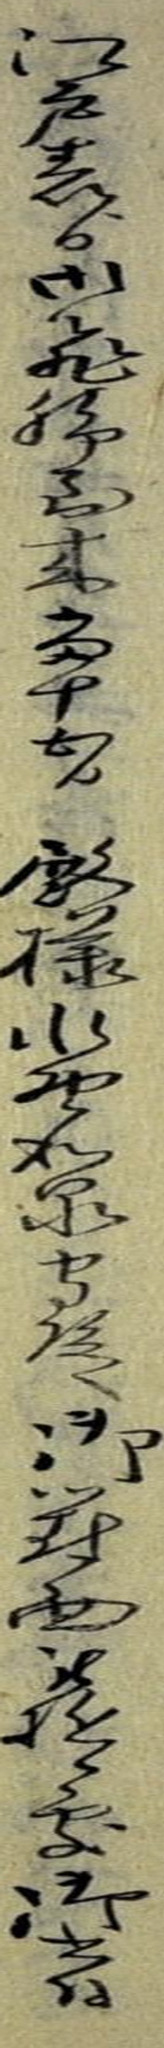〇江戸表ゟ御飛脚到来当十五日殿様水野和泉守殿へ御対面被遊候処御書付
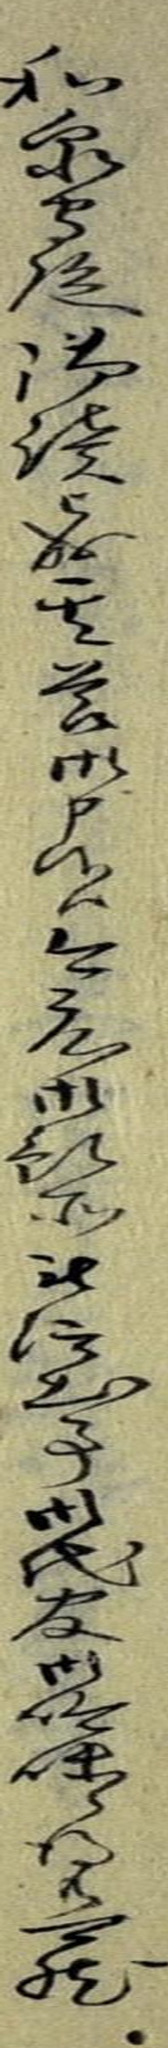和泉守殿御読被成其節御申候ハ今度御預所被仰出事御代官御吟味候得共可然
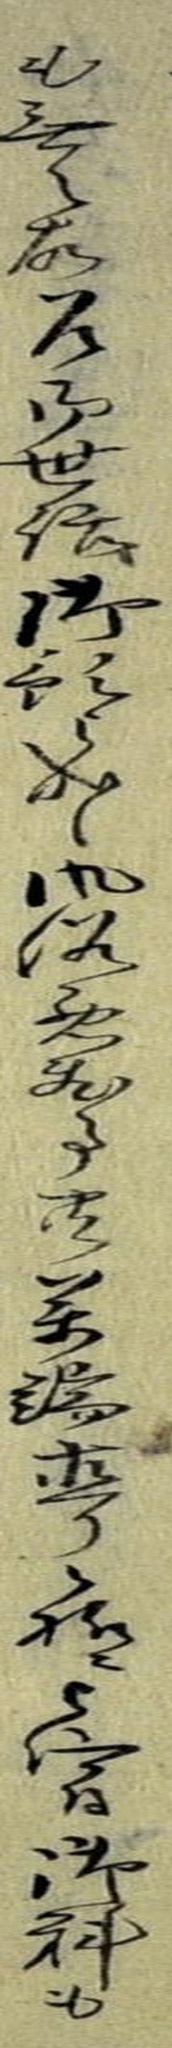も無之故乍御世話御預被成候風俗悪敷事共万端直り候様ニ被仰付御料も
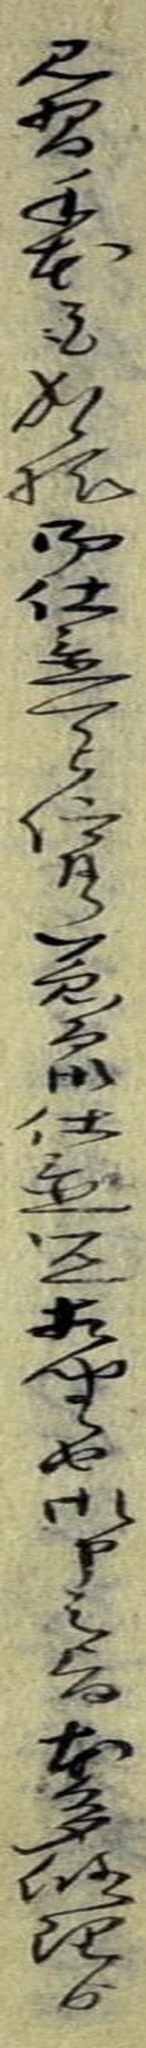見習手本ニも成候様御仕置可被仰付候兼而御仕置宜相聞候由御申之旨本多修理ゟ
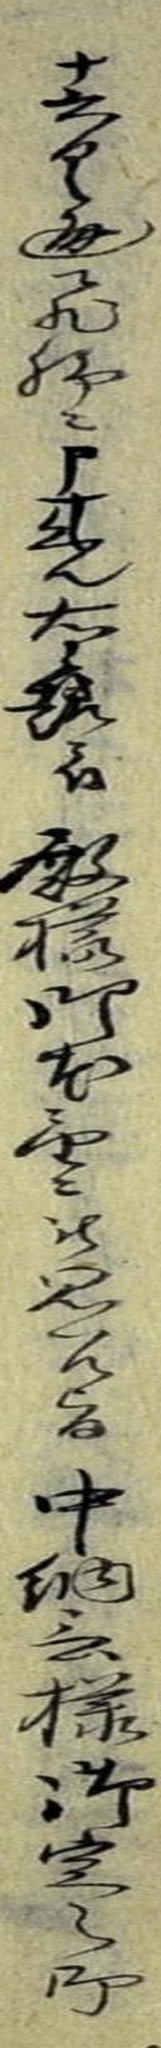十六日之通飛脚ニ申来ル右之趣ニ付殿様御本望ニ被思召旨中納言様御定之御
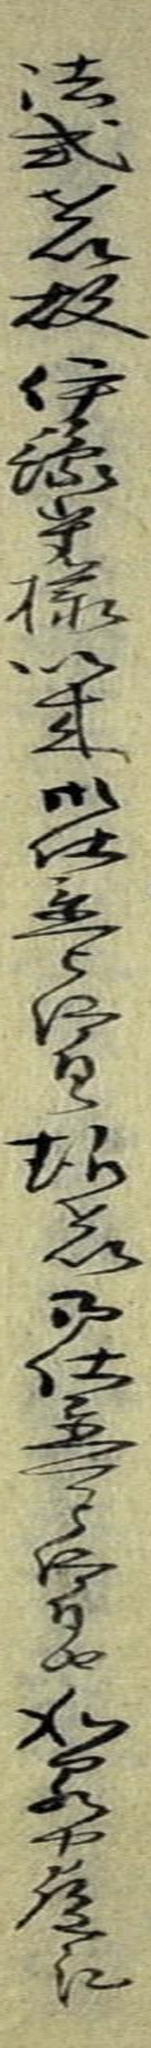法式を以故伊予守様以来御仕置被仰付候趣を以御仕置可被仰付由和泉守殿江
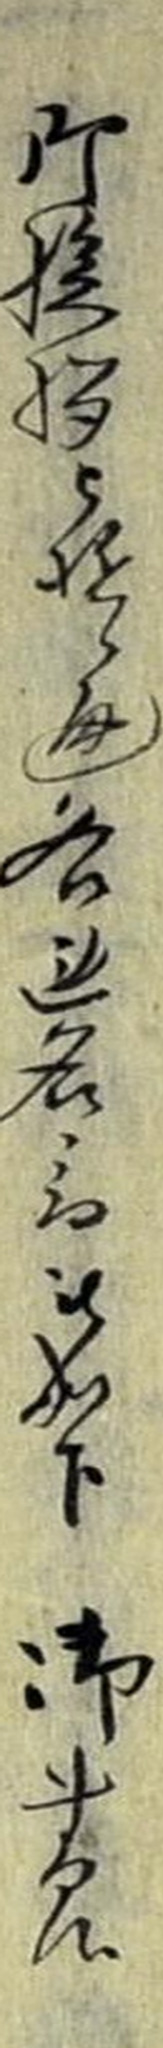御挨拶被遊候通各連名ニ而被成下御書候
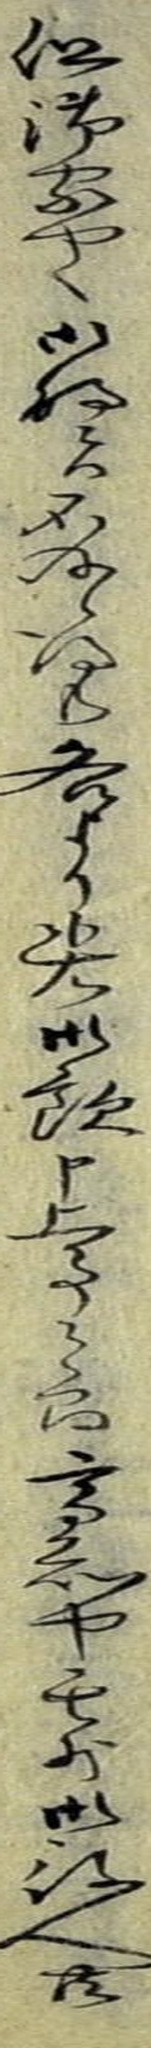但御家中へ御触ニハ不及候得共各よりも右御歓申上事ニ候間高知中其外御役人共
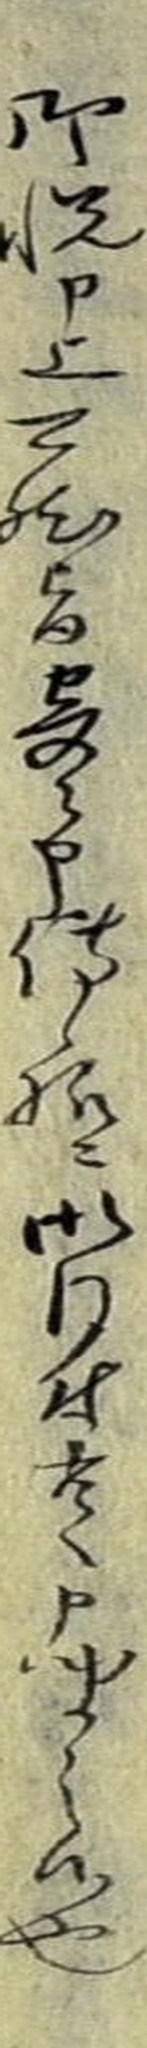御悦申上可然旨寄々申伝候様ニ御目付共へ申聞之候也
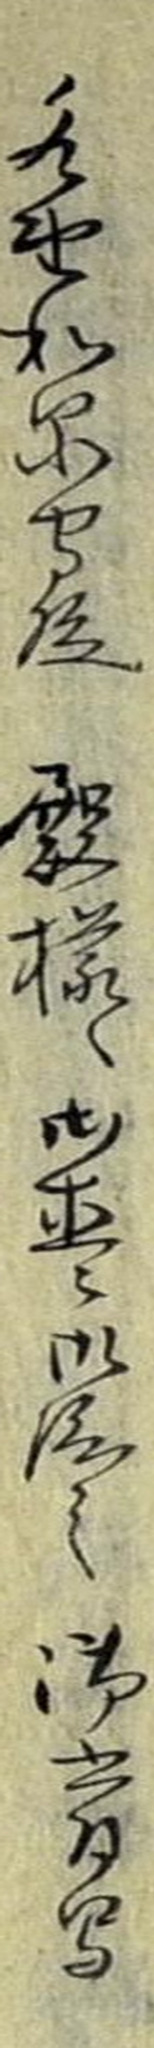水野和泉守殿殿様へ御直ニ御渡之御書付写
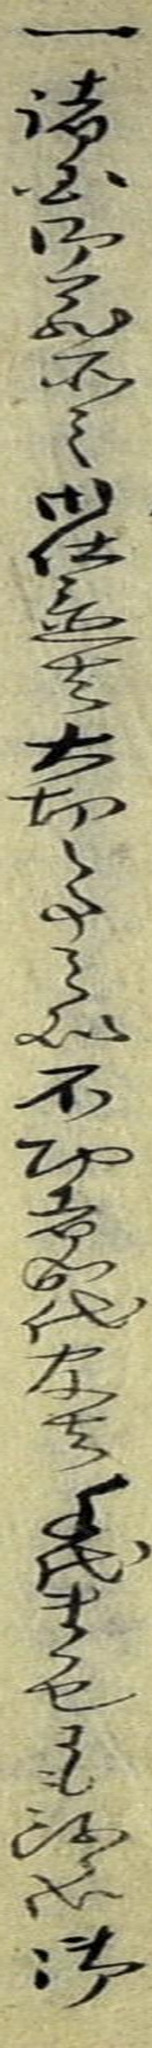一諸国御蔵所之御仕置者大切之事ニ候処不巧者成代官者手代まかせにも致候哉御
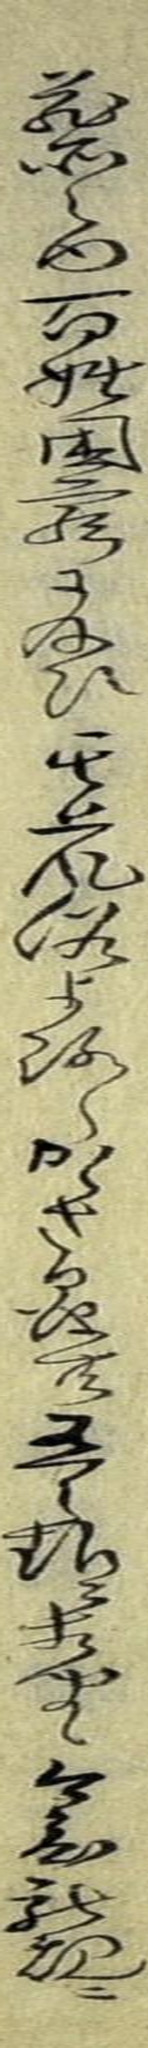蔵所之内百姓困窮に及ひ其上風俗よろしからさる儀共有之趣ニ相聞候今度新規ニ
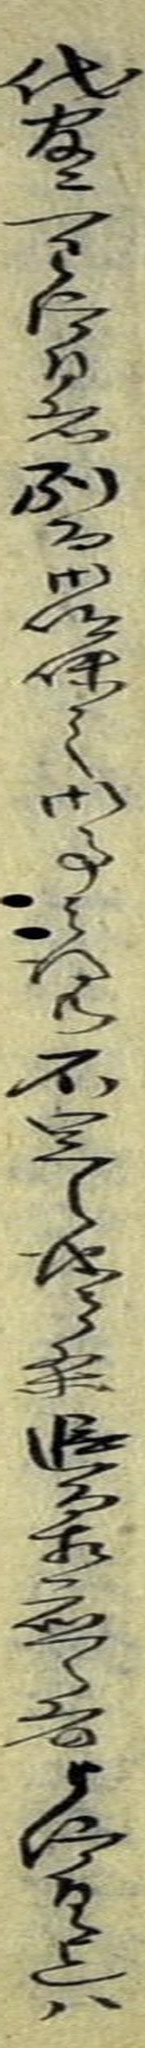代官ニ可被仰付者別而御吟味之御事ニ候得共不足之儀ニ候条追而相応之者被仰付候迄ハ
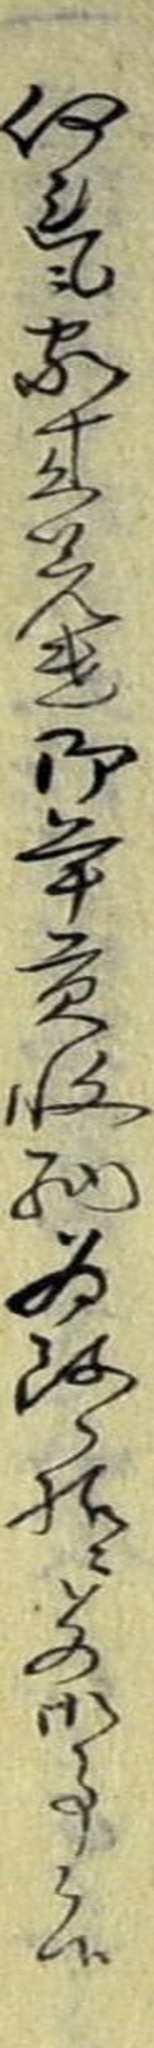何れも家来差遣御年貢収納為致候様ニとの御事ニ候
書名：命令之部 一
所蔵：福井県文書館 Fukui Prefectural Archives
